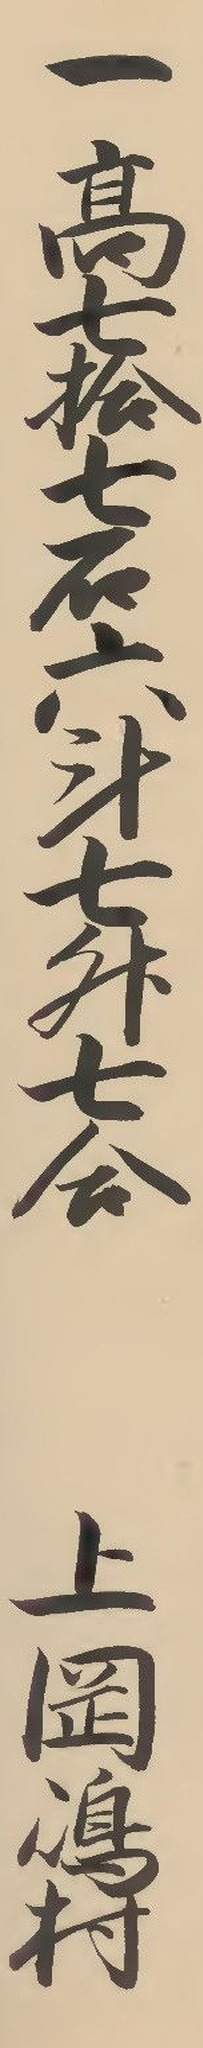一高七拾七石六斗七升七合上岡島村
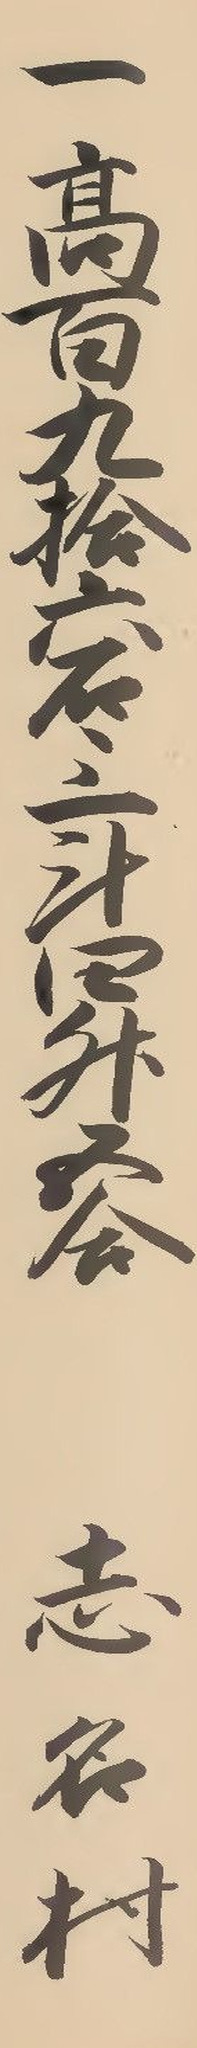一高百九拾六石三斗四升五合志名村
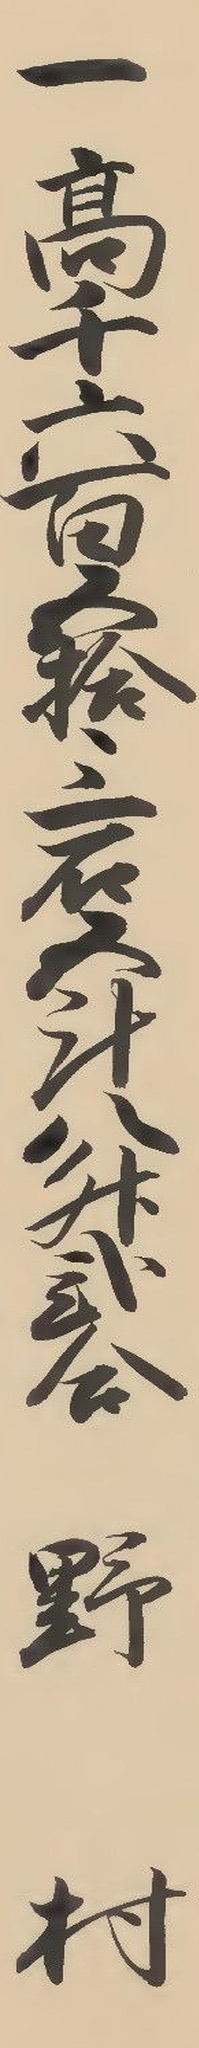一高千六百五拾三石五斗八升弐合野村
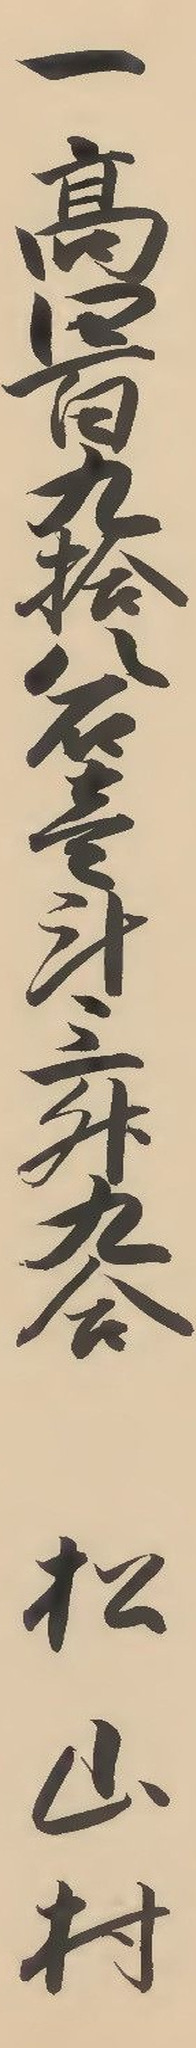一高四百九拾八石壱斗三升九合松山村
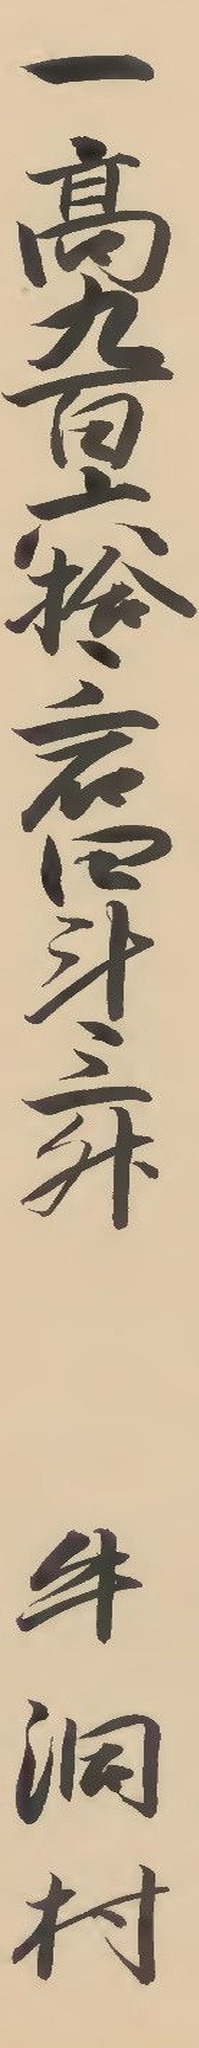一高九百六拾三石四斗三升牛洞村

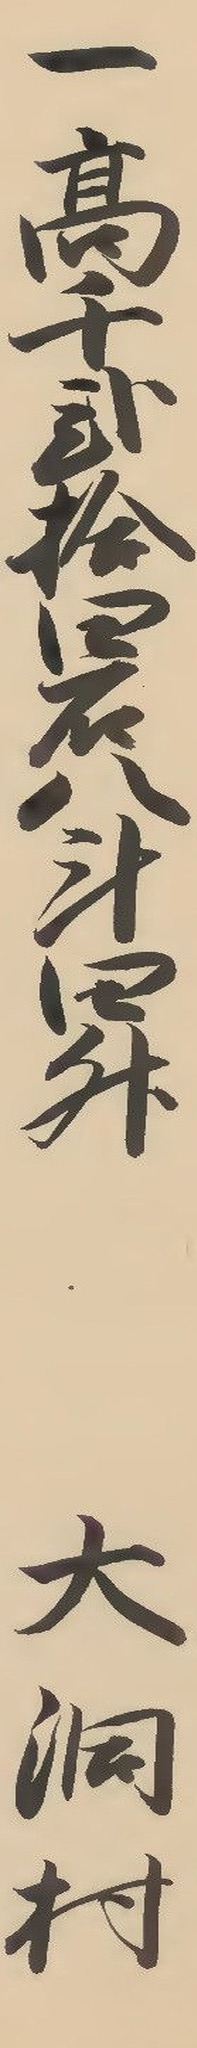一高千弐拾四石八斗四升大洞村
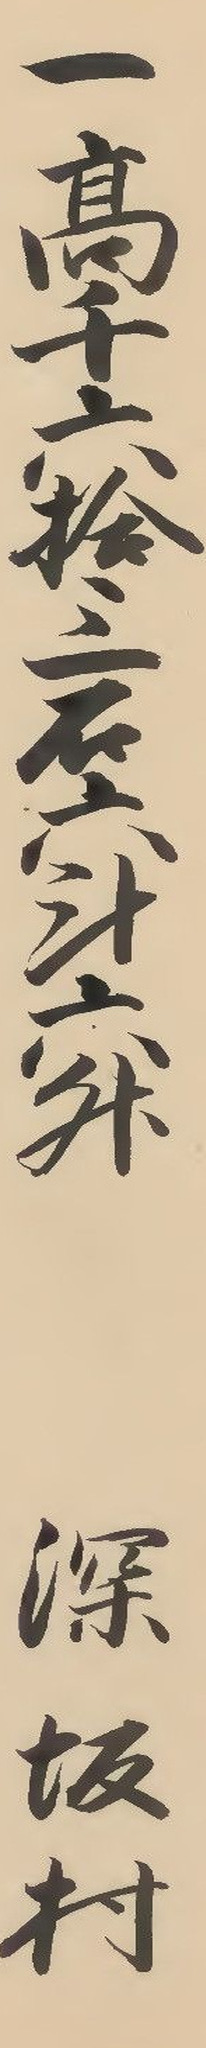一高千六拾三石六斗六升深坂村
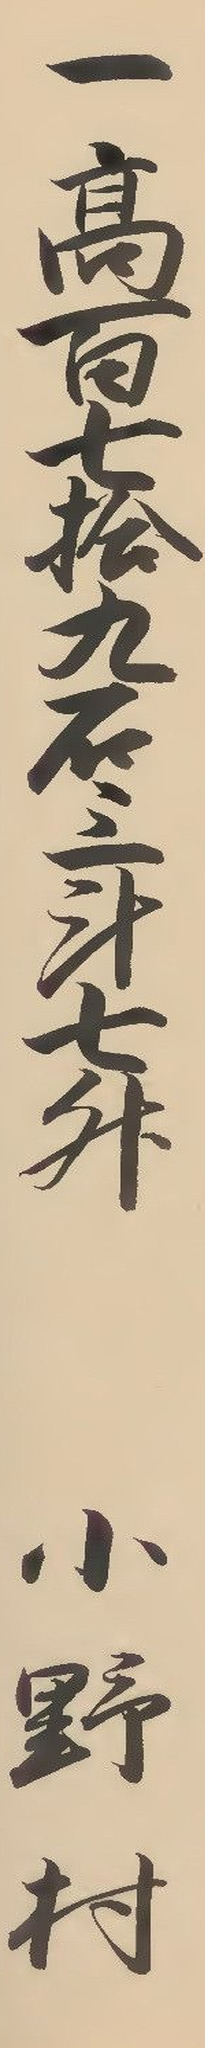一高百七拾九石三斗七升小野村
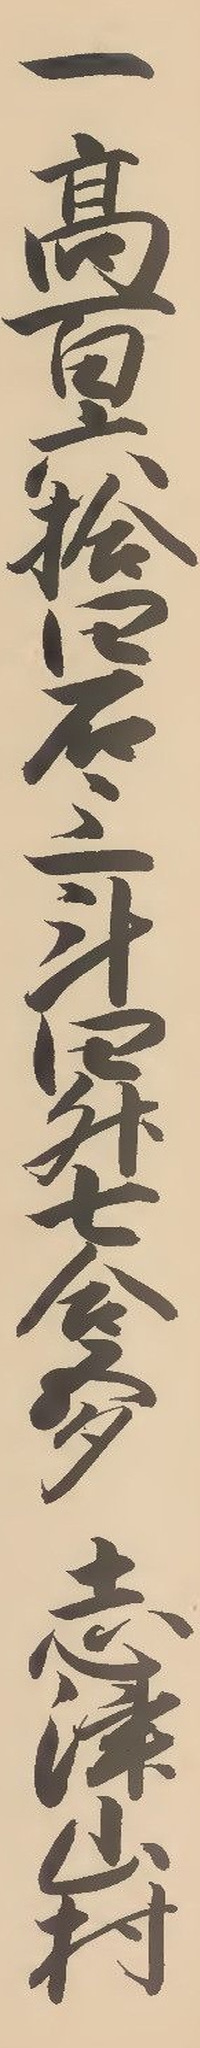一高百六拾四石三斗四升七合五勺志津山村
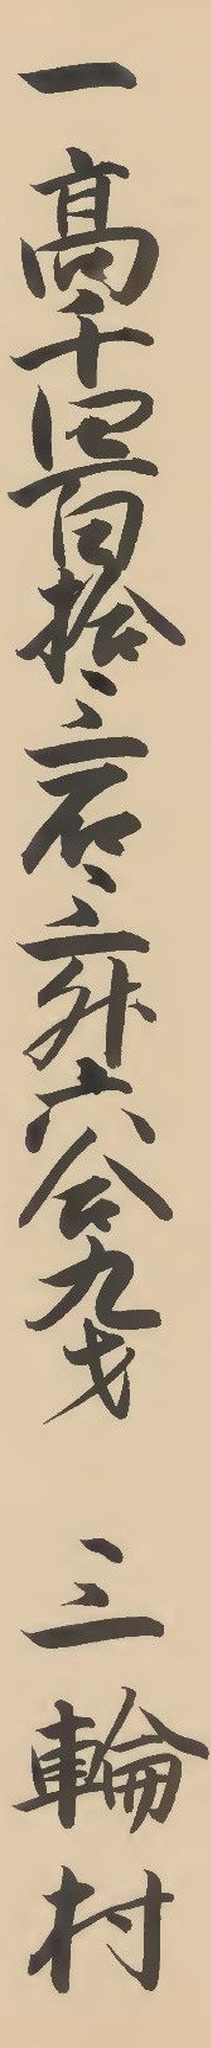一高千四百拾三石三升六合九才三輪村
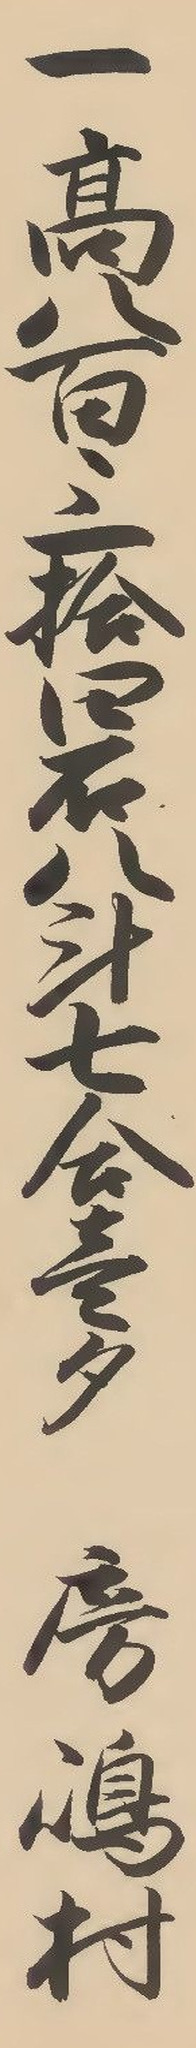一高八百三拾四石八斗七合壱勺房島村
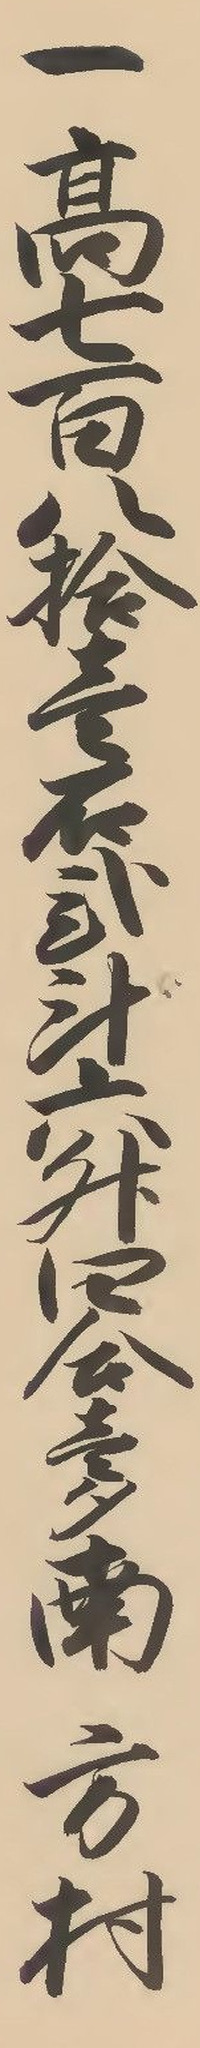一高七百八拾壱石弐斗六升四合壱勺南方村

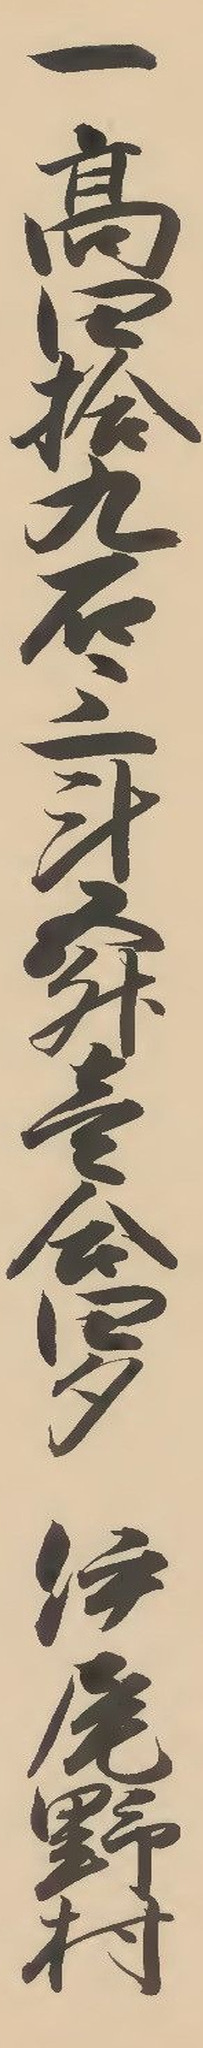一高四拾九石三斗五升壱合四勺伊尾野村
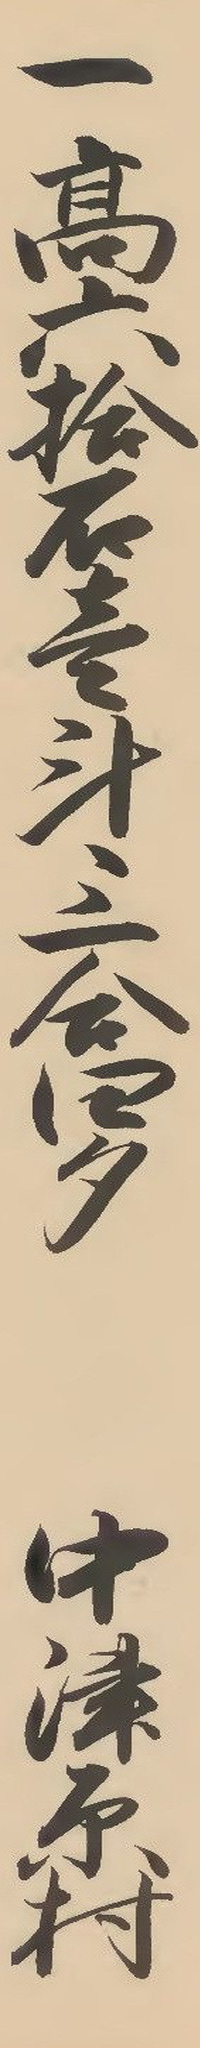一高六拾石壱斗三合四勺中津原村
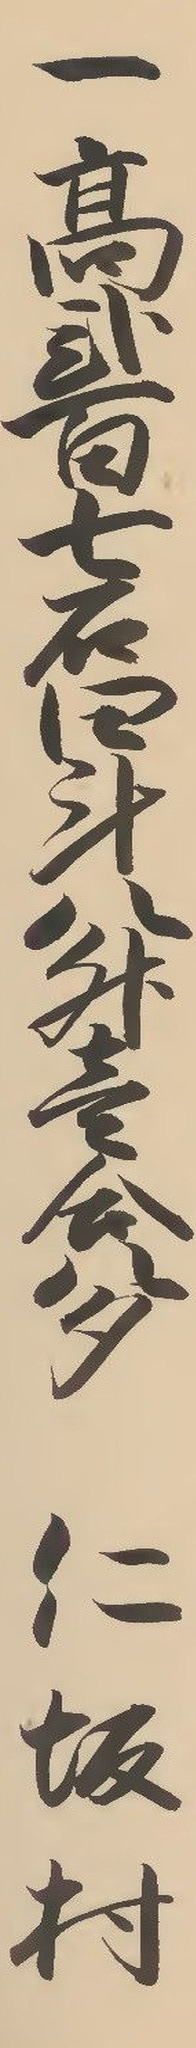一高弐百七石四斗八升壱合八勺仁坂村
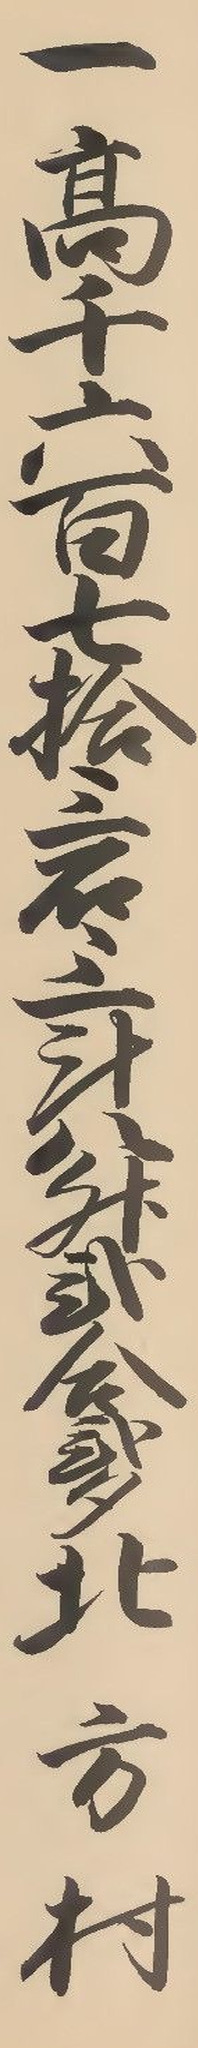一高千六百七拾三石三斗八升弐合弐勺北方村
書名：美濃国郷帳
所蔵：国立公文書館 National Archives of Japan
